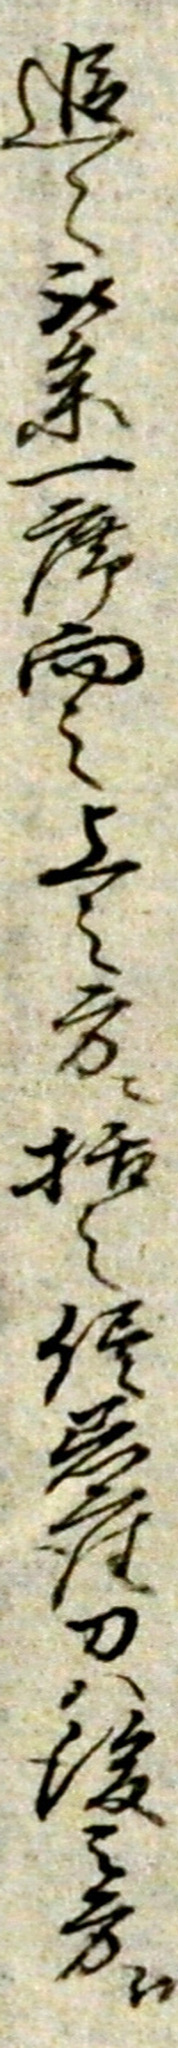追々被参一席向之上之方ニ抜之儘着座刀ハ渡之方江
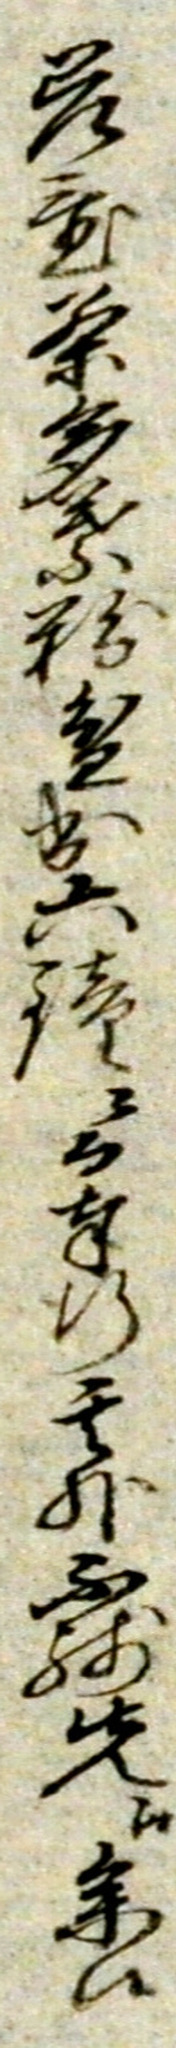差置茶多葉粉盆出六鐘二而奉行其外不残先江参候
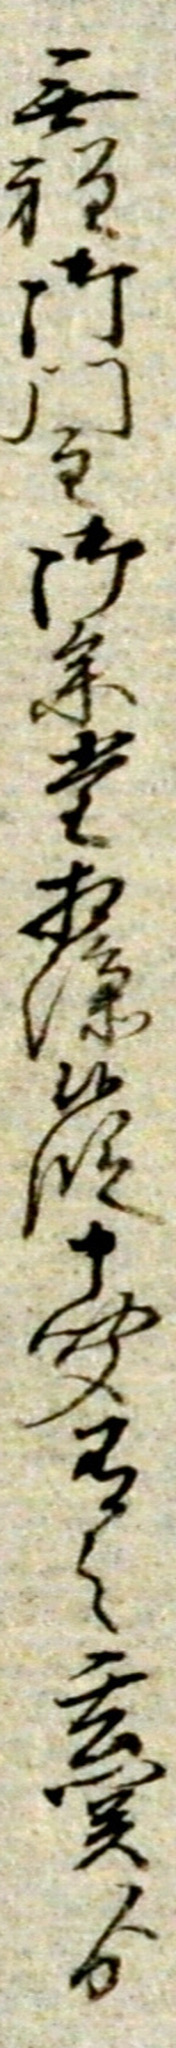無程御門主御参堂相除候段申聞有之玄関ゟ
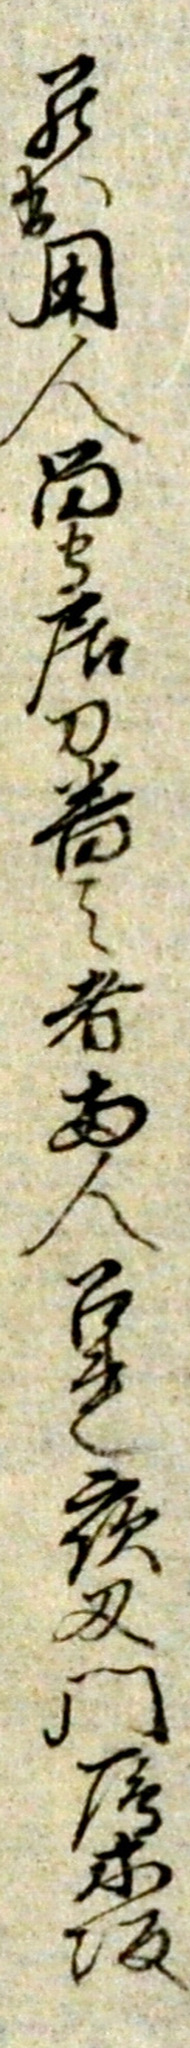罷出用人留守居刀番之者両人召連夜刃門雁木坂
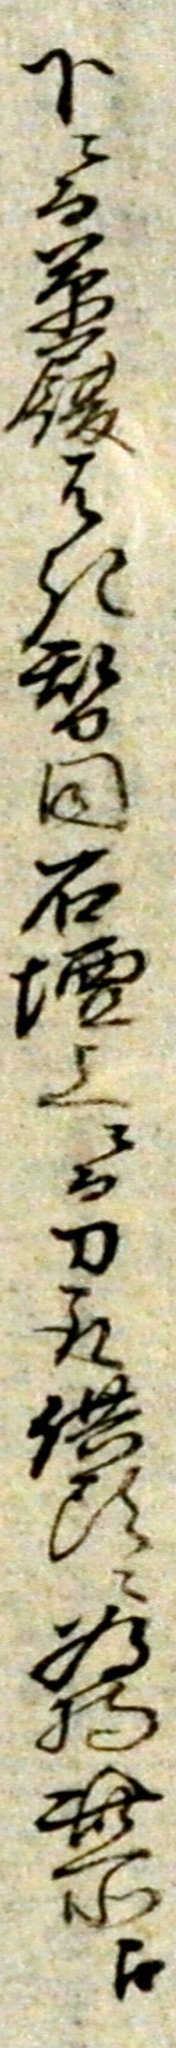下ニ而草履はき替同石壇上ニ而刀取供頭ニ為持此所江
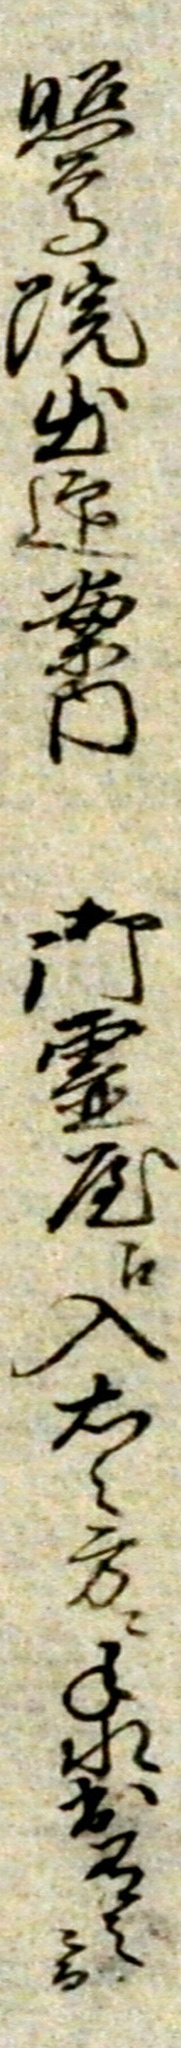照尊院出迎案内御霊屋江入右之方ニ手水出有之ニ而
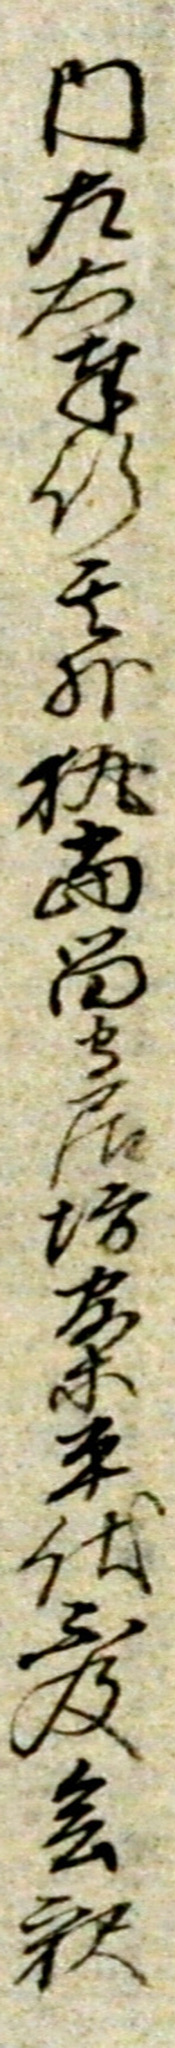内左右奉行其外執当留守居坊家等平伏不及会釈
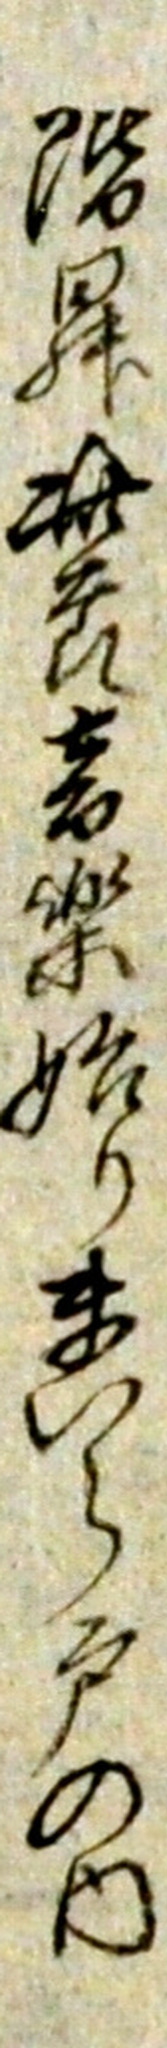階昇此節音楽始りまいり戸の内
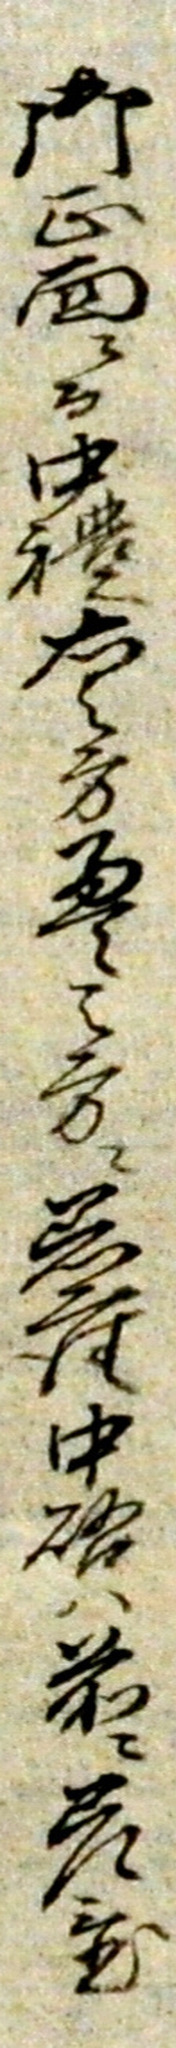御正面ニ而御礼右之方畳之方ニ着座中路ハ前ニ差置
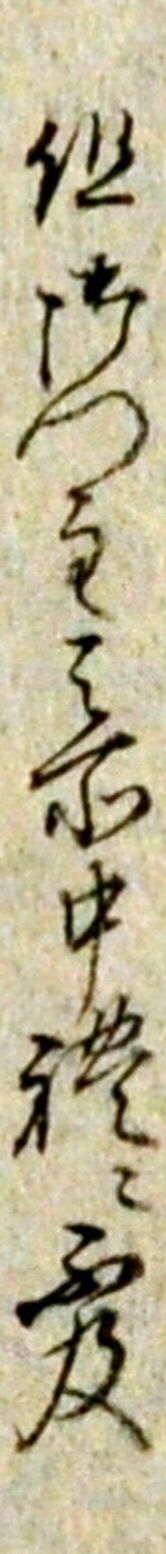但御門主之所中礼ニ不及
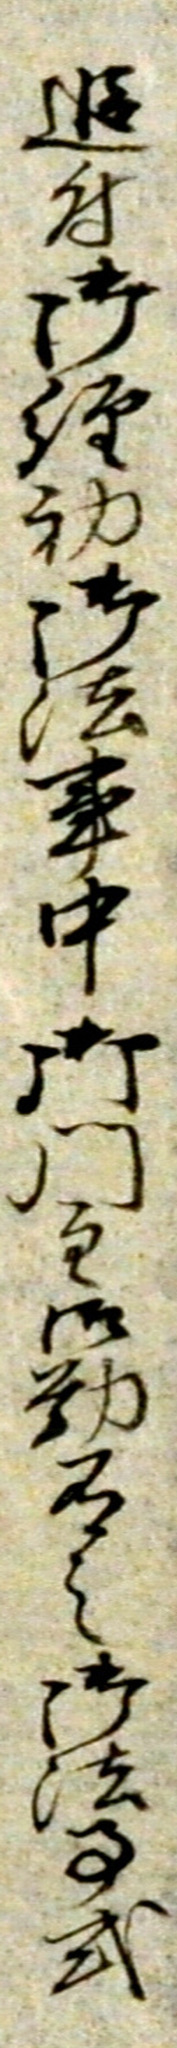追付御経初御法事中御門主御勤有之御法事式
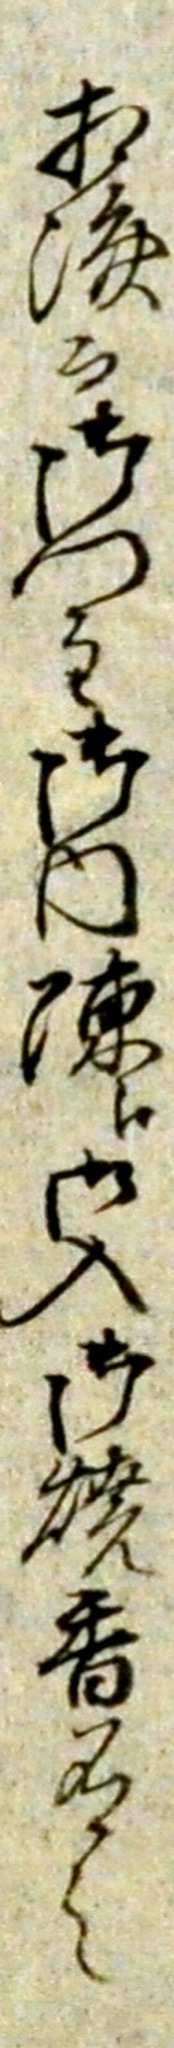相済而御門主御内陣江御焼香有之
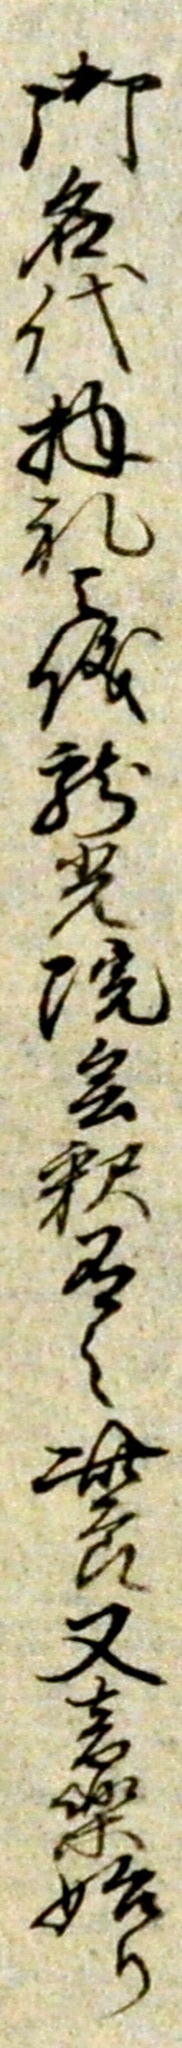御名代拝礼之儀龍光院会釈有之此節又音楽始り
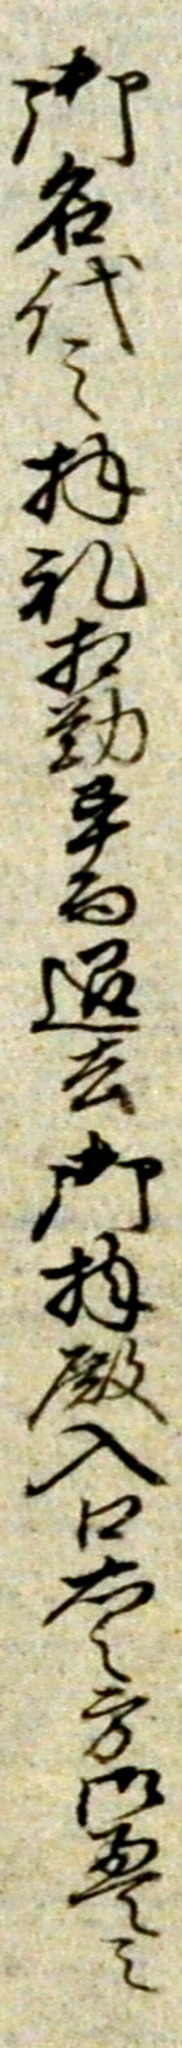御名代之拝礼相勤畢而退去御拝殿入口右之方御畳之
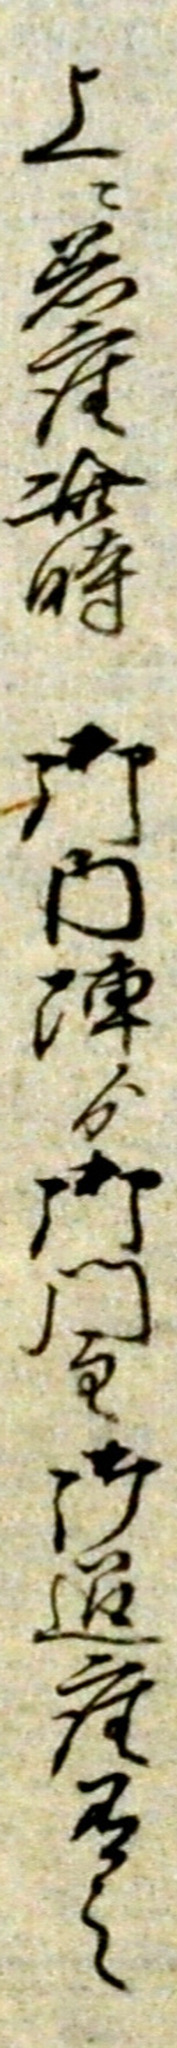上ニ着座此時御内陣ゟ御門主御退座有之
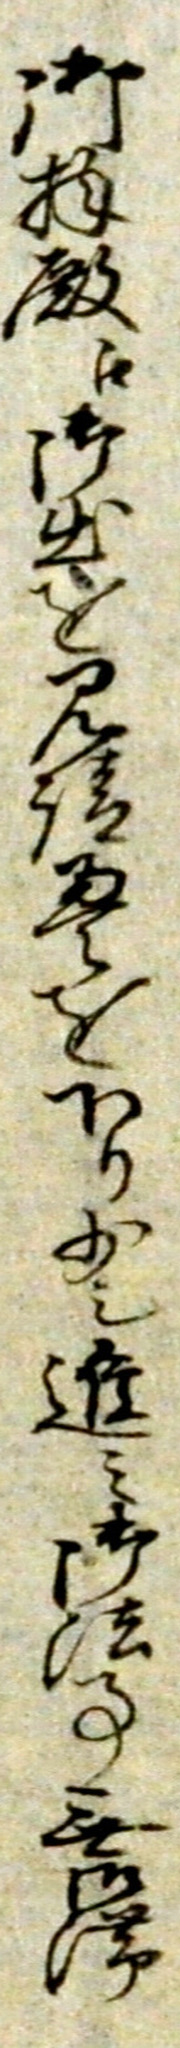御拝殿江御出を見請畳を下り少シ進ミ御法事無御滞
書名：日光御名代相勤候節ノ留
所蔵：伊那市立高遠町図書館・合同会社AMANE
